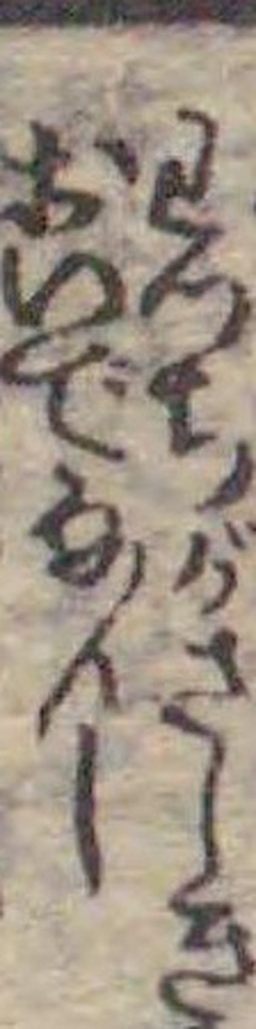おいでなんし
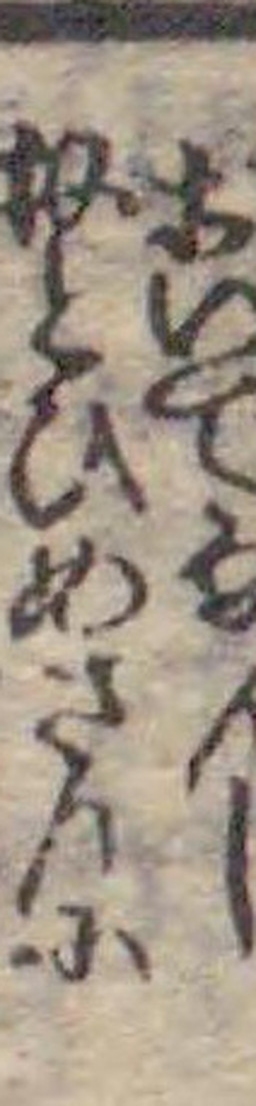おとひめさんに
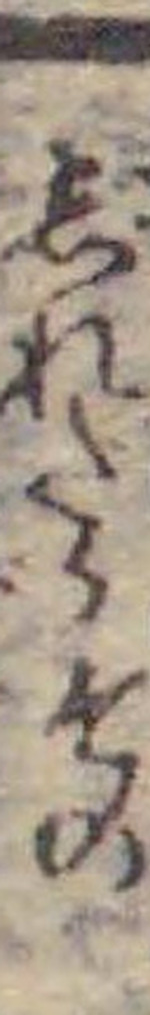しれたらその
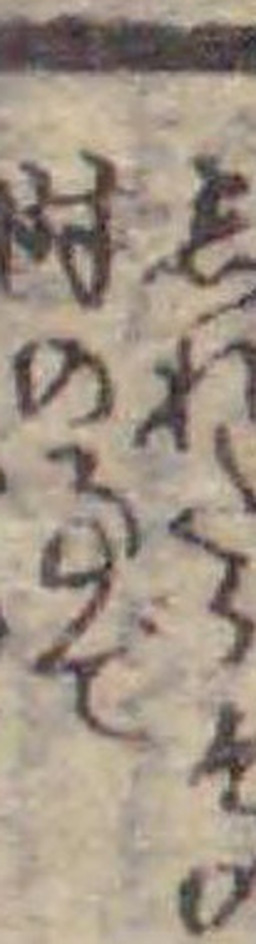時の事で

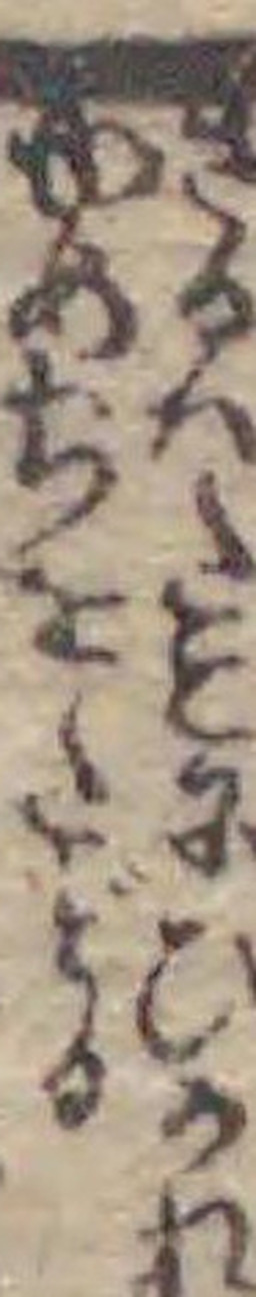ゆめぢをたどる
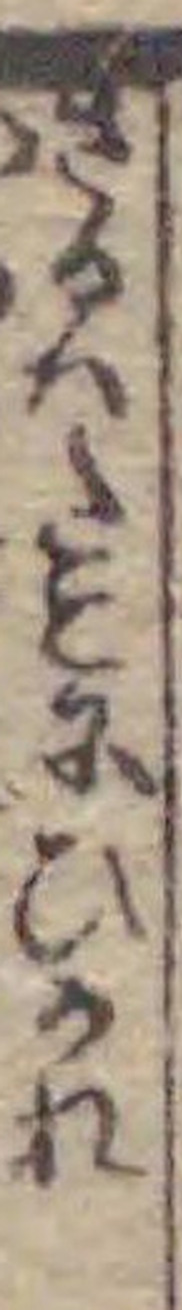さるはたこにひかれ
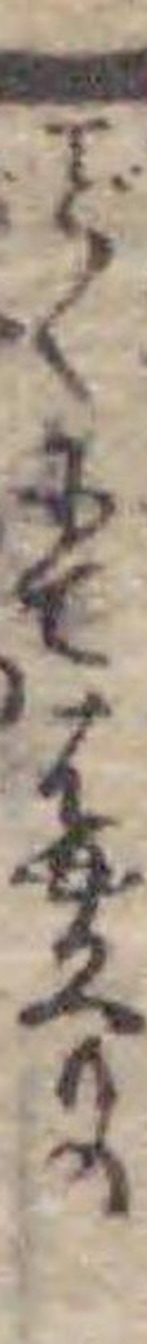ごとくにてはやかへりの
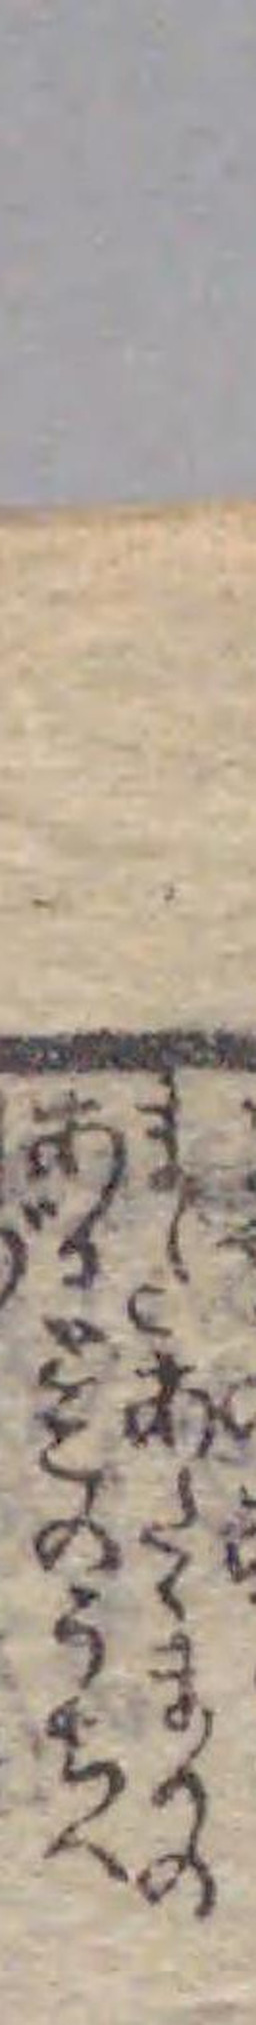あるとこのうちへ
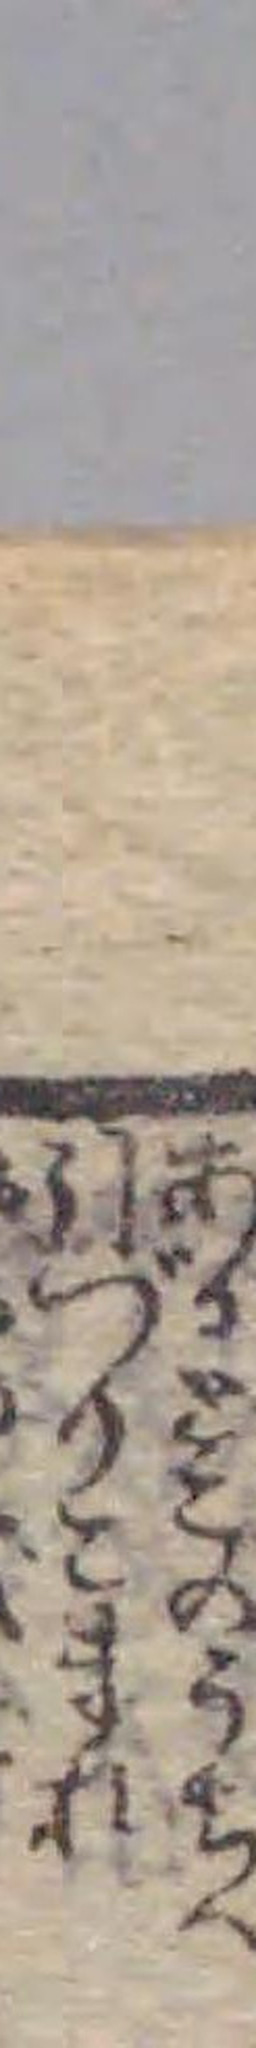引づりこまれ
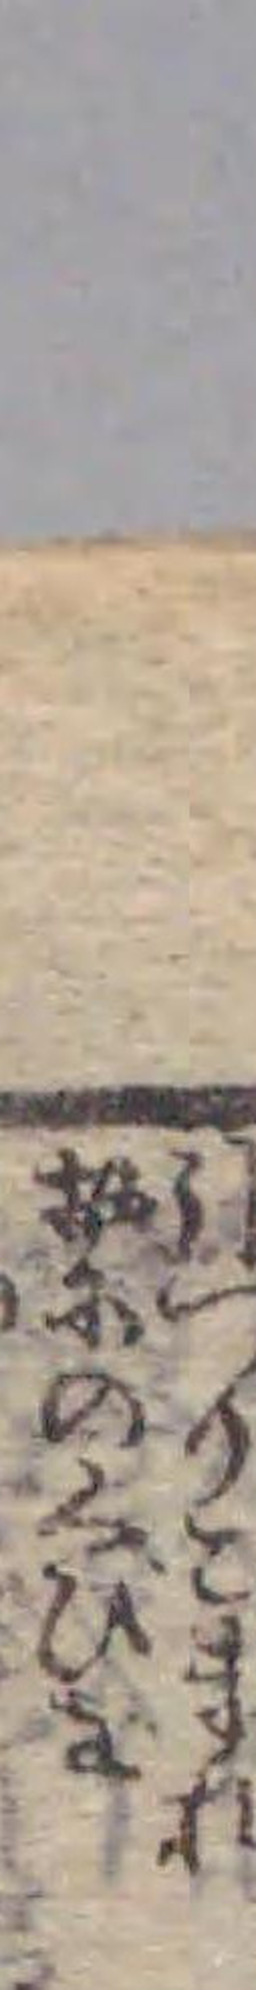おにのくひを
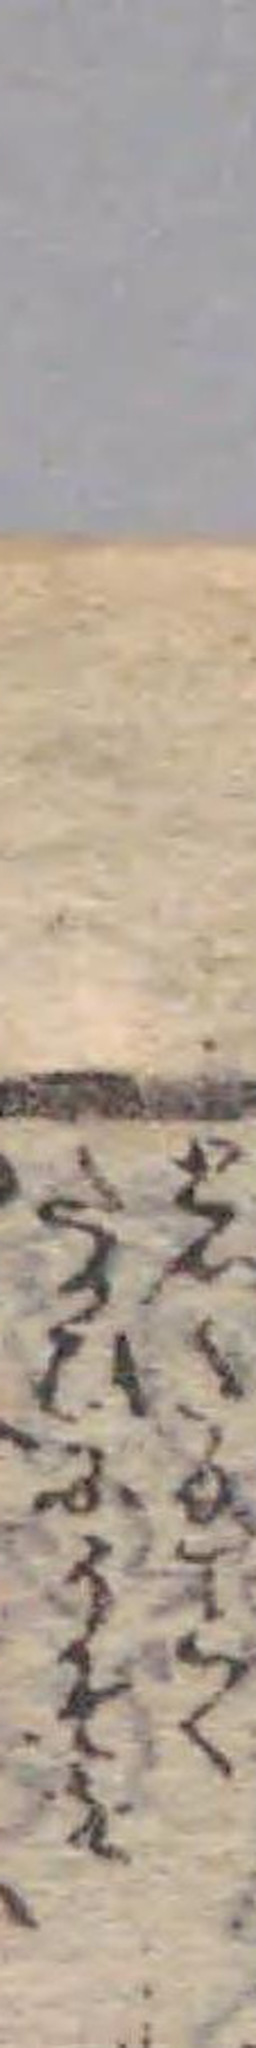たかひにうそを
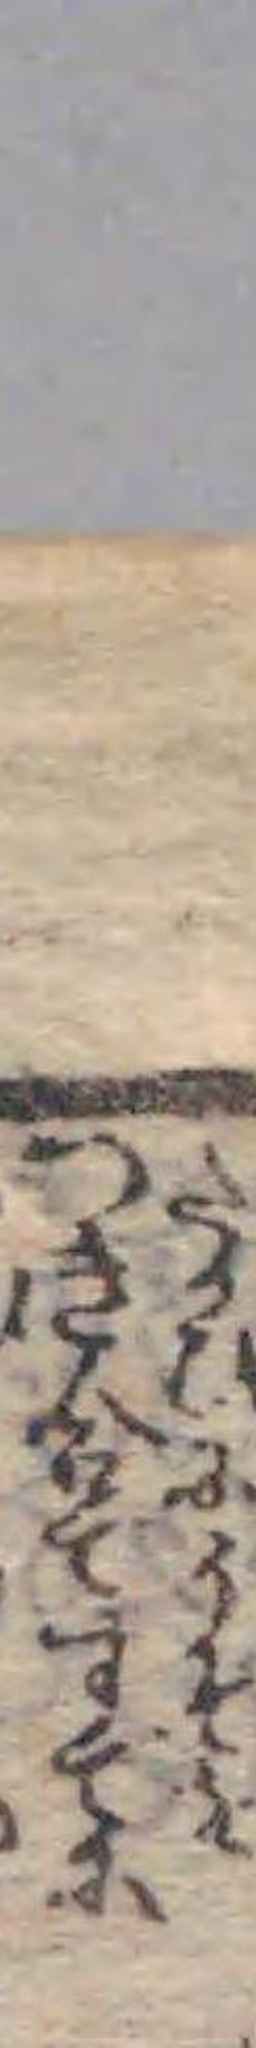つき合てすでに
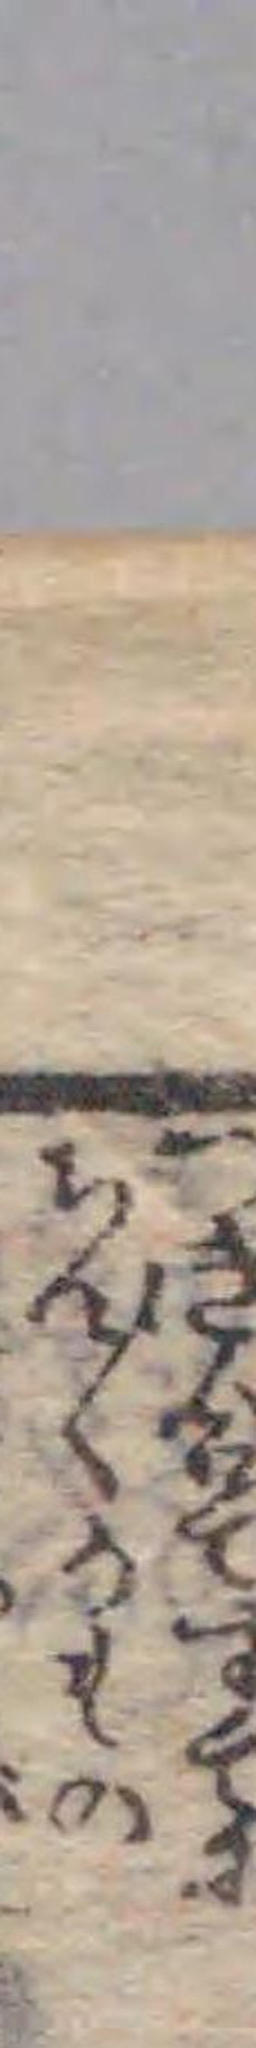ちん〳〵かもの
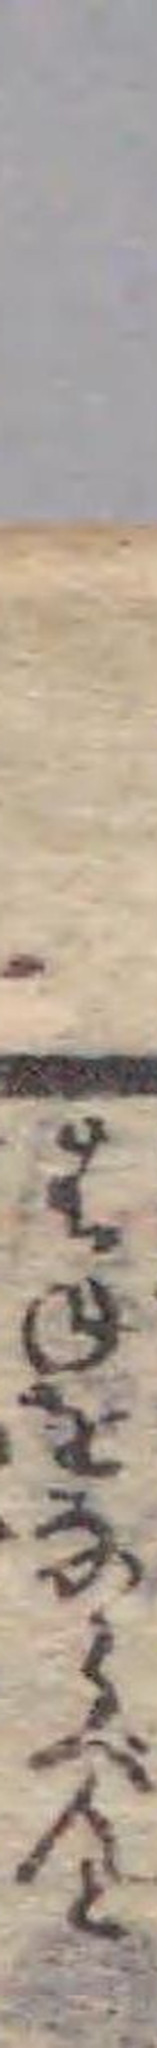はねをならべんと
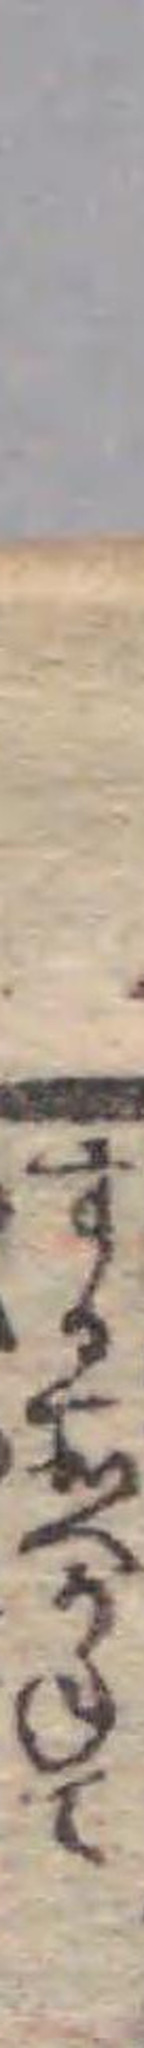する所へかねて
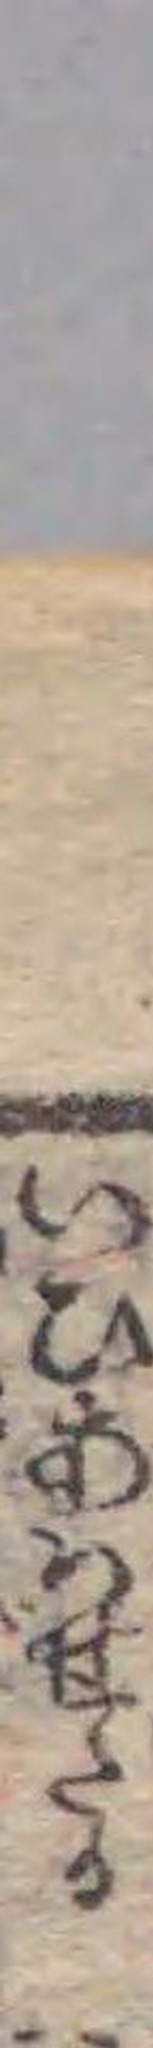いひあはせたる
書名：竜宮苦界玉手箱 : 3巻
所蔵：国立国会図書館 National Diet Library, JAPAN
